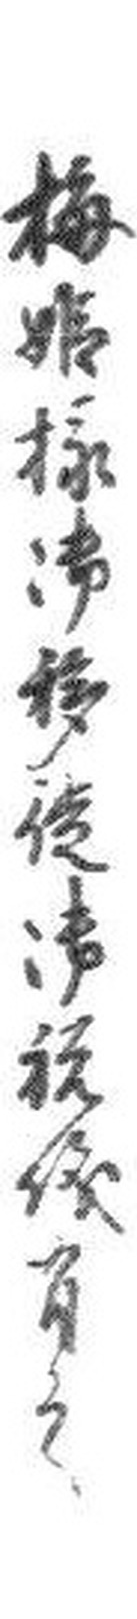梅姫様御移徙御祝儀有之
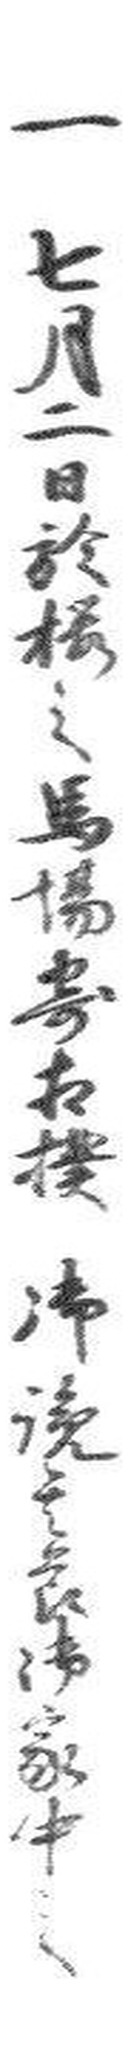一七月二日於桜之馬場寄相撲御覧其節御家中之
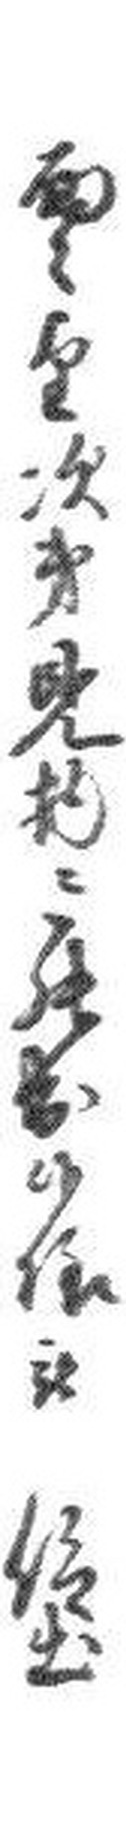面々望次第見物ニ罷出候様被仰出
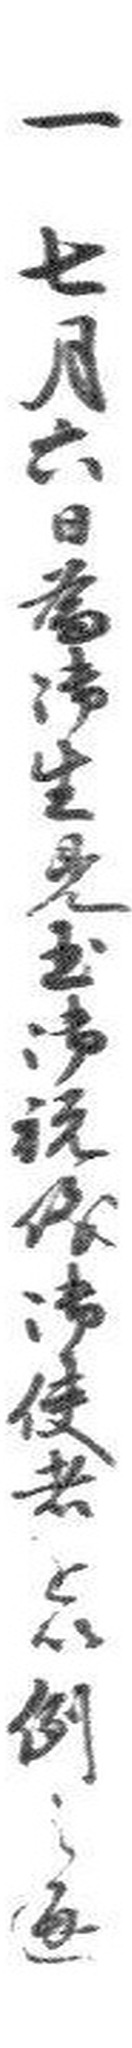一七月六日為生身魂御祝儀御使者を以例之通

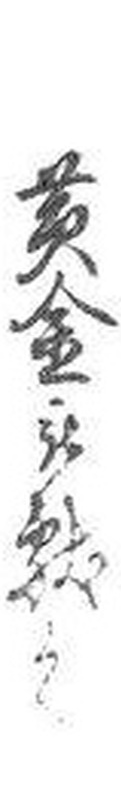黄金被献之
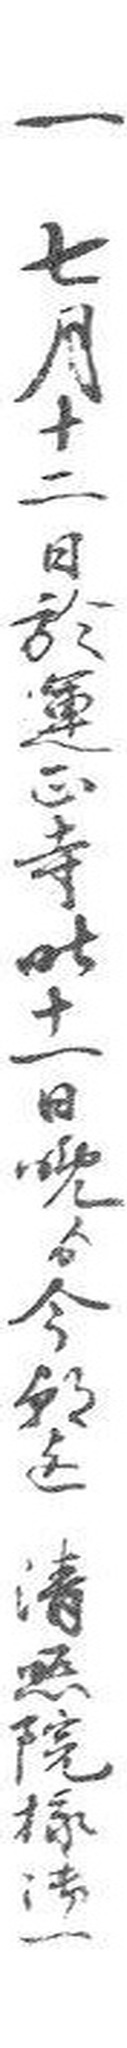一七月十二日於運正寺昨十一日晩ゟ今朝迄清照院様御一
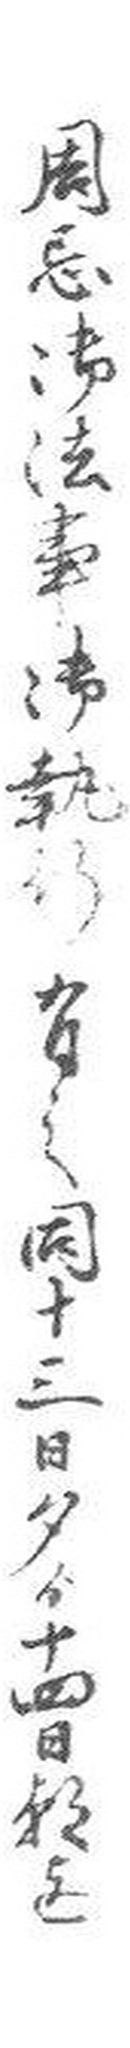周忌御法事御執行有之同十三日夕ゟ十四日朝迄
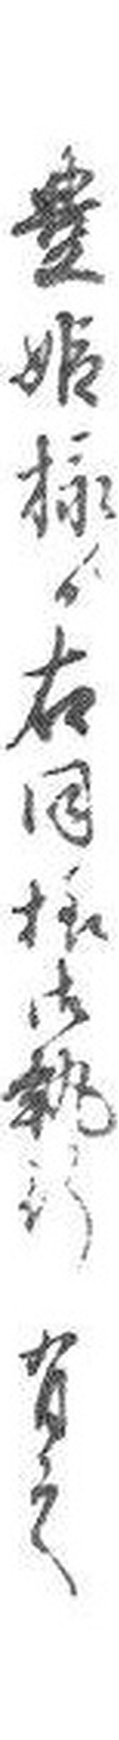豊姫様ゟ右同様御執行有之
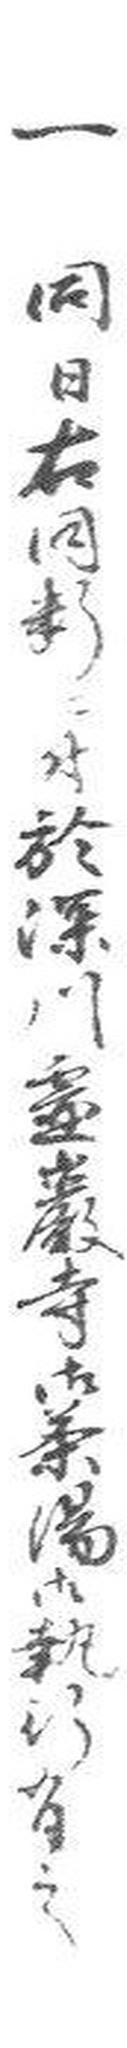一同日右同断ニ付於深川霊巌寺御茶湯御執行有之
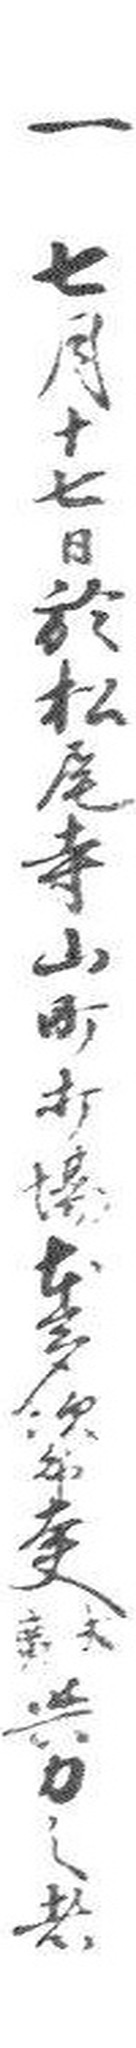一七月十七日於松尾寺山町打場本多次郎大夫丈広与力之者
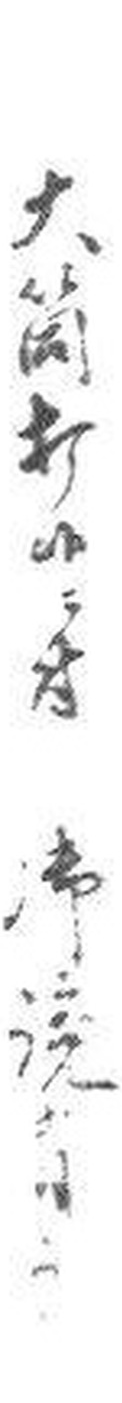大筒打候ニ付御覧有之
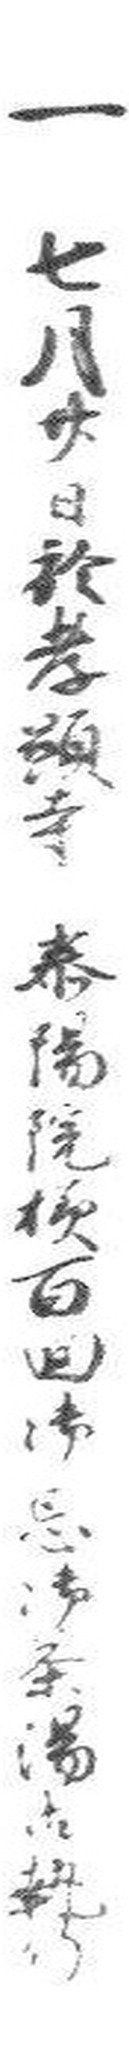一七月廿日於孝顕寺泰陽院様百回御忌御茶湯御執行
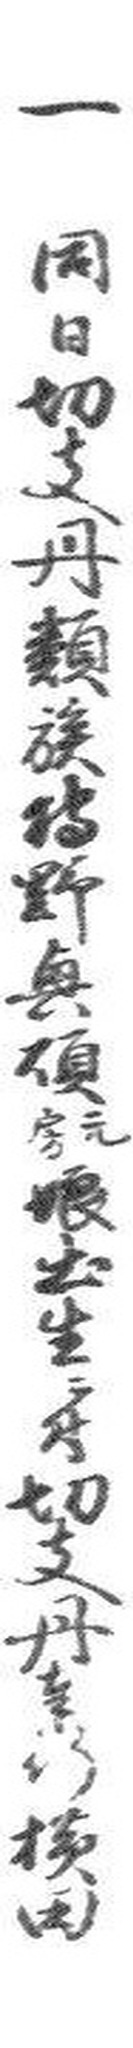一同日切支丹類族狩野興碵元房娘出生ニ付切支丹奉行横田
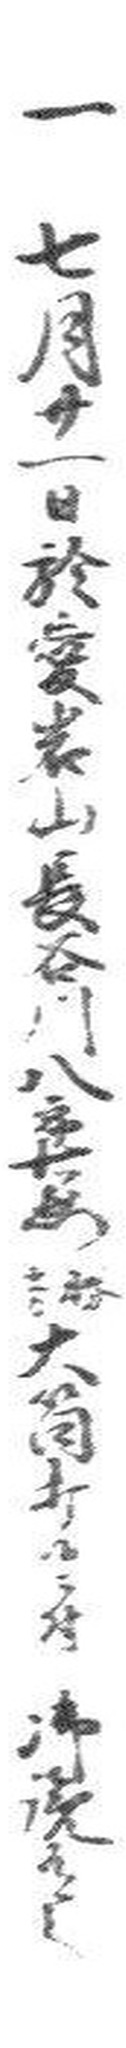一七月廿一日於愛宕山長谷川八郎右衛門大筒打候ニ付御覧有之
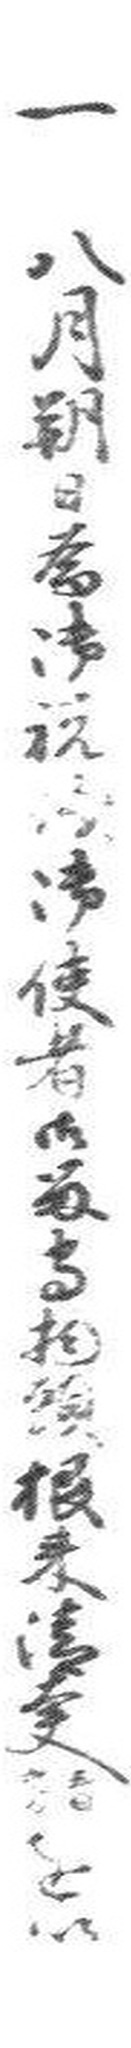一八月朔日為御祝儀御使者御留守居物頭根来清太夫房を以
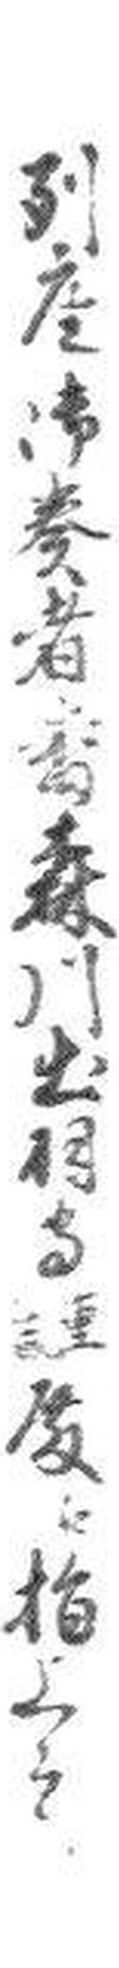列座御奏者番森川出羽守重殿江指上之
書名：家譜 二十九 吉邦公 従正徳二年到正徳三年
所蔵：福井県文書館 Fukui Prefectural Archives
